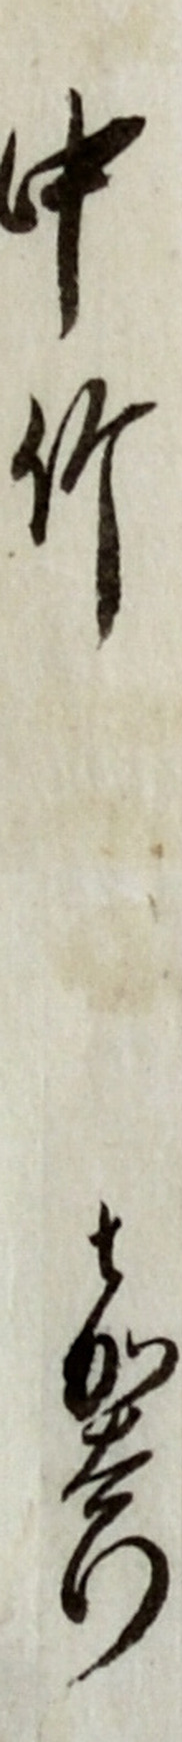中竹嘉右衛門
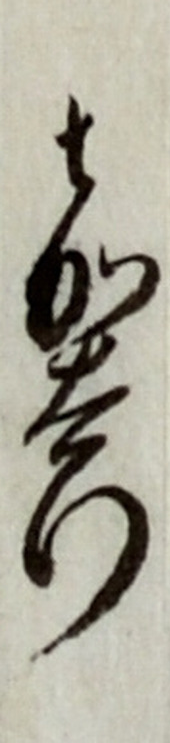小右衛門

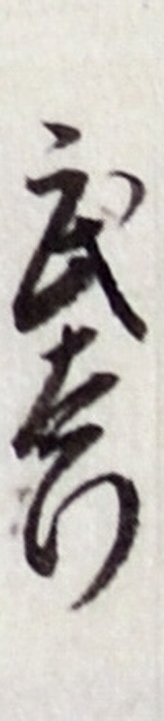小右衛門
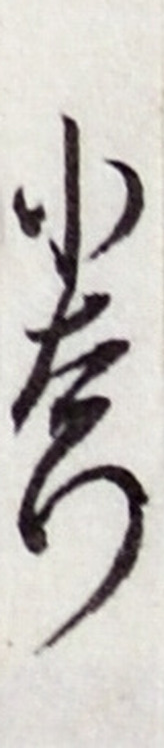小右衛門
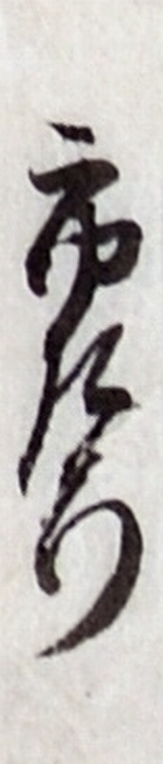市左衛門
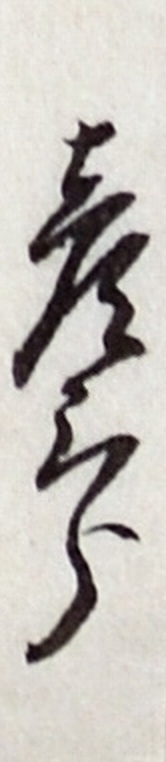彦三郎
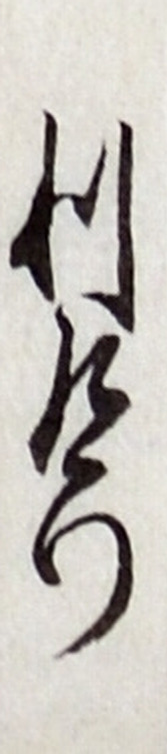市左衛門
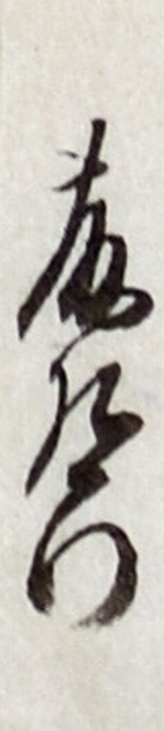藤左衛門
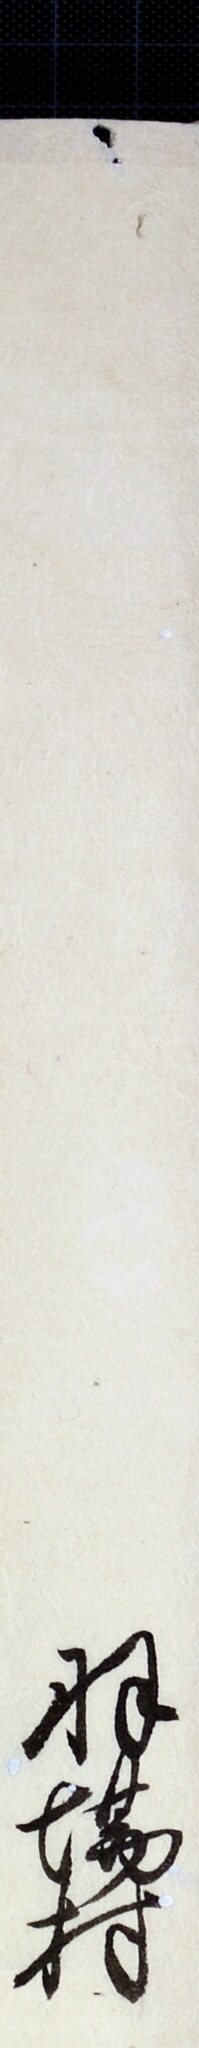羽場村
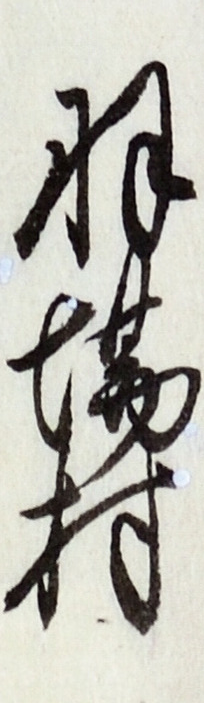羽場村
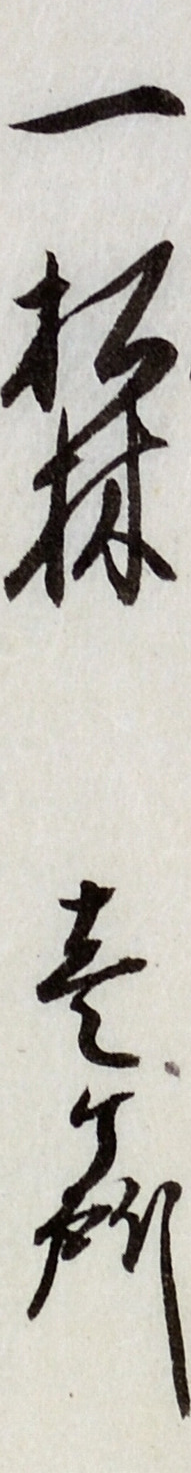一松林壱ケ所
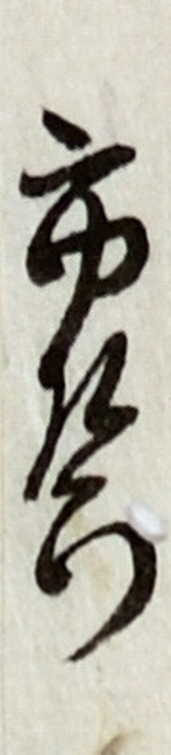市左衛門
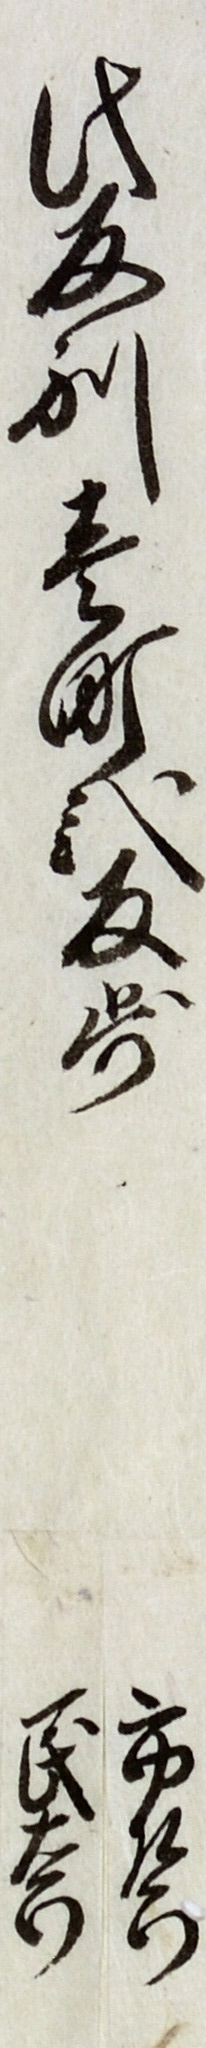此反別壱町弐反歩市左衛門
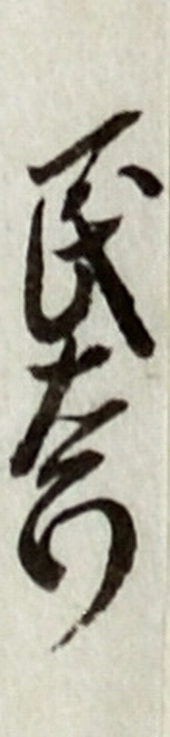民右衛門
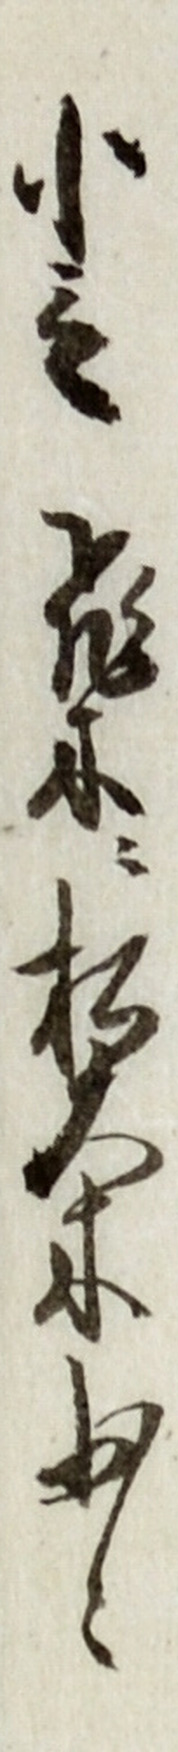小立飛木ニ松大木少々

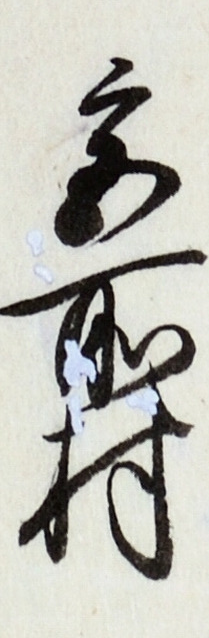宮所村
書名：御領分中御林御藪附帳
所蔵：伊那市立高遠町図書館・合同会社AMANE
